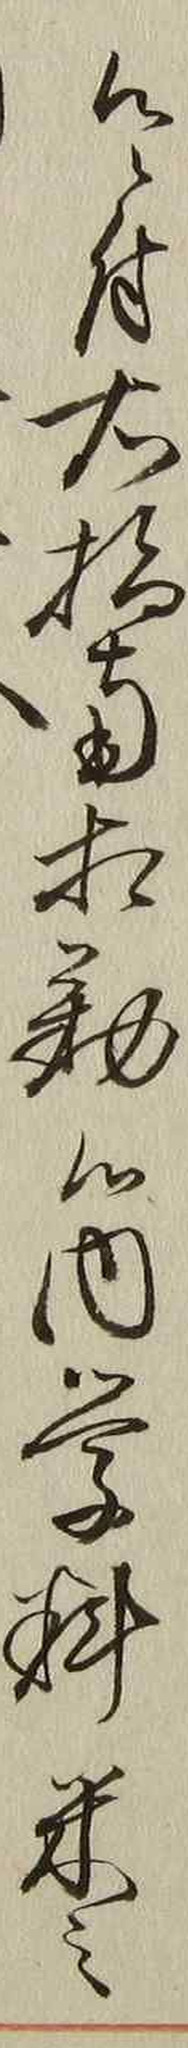候ニ付右指南相勤候内学料米之
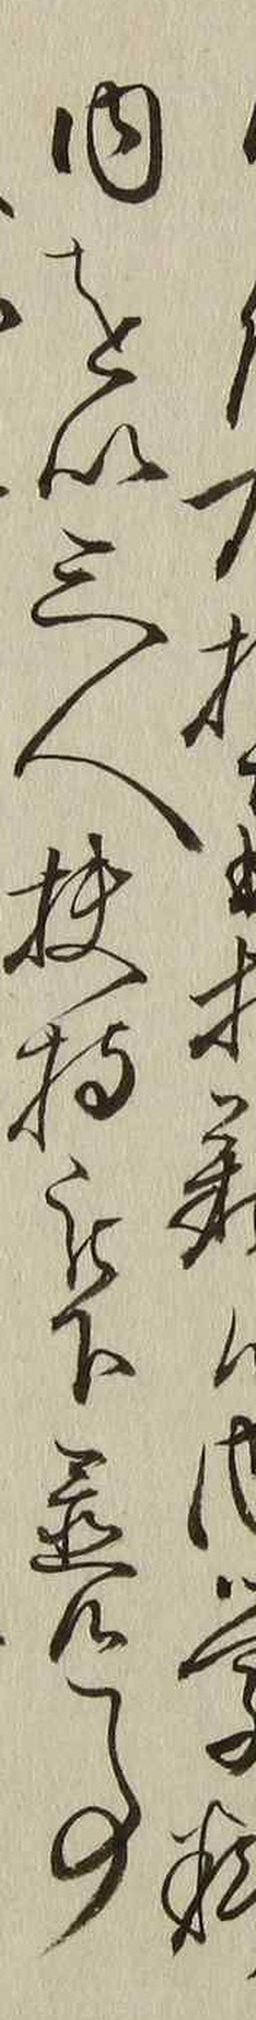内を以三人扶持被下置候事
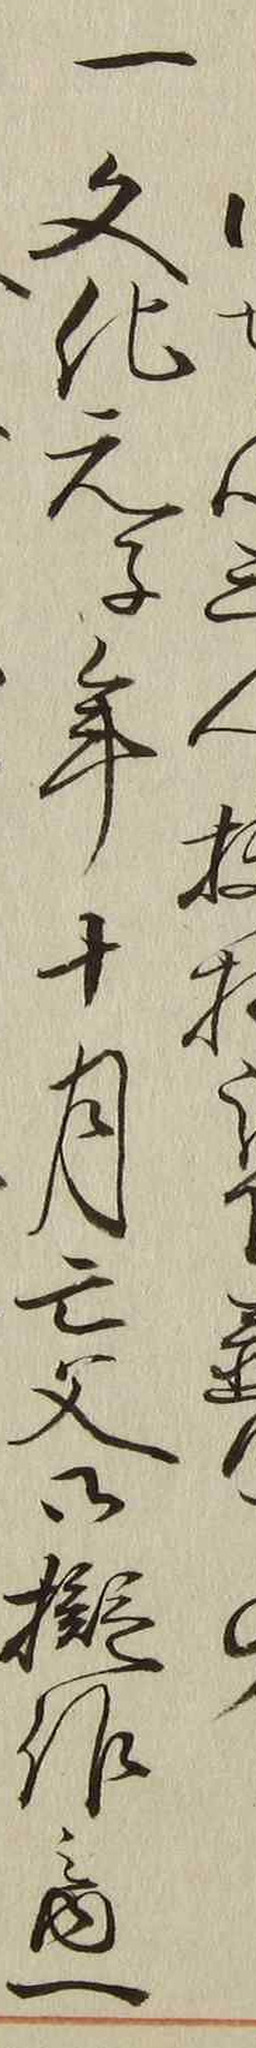一文化元子年十月亡父御擬作之内一
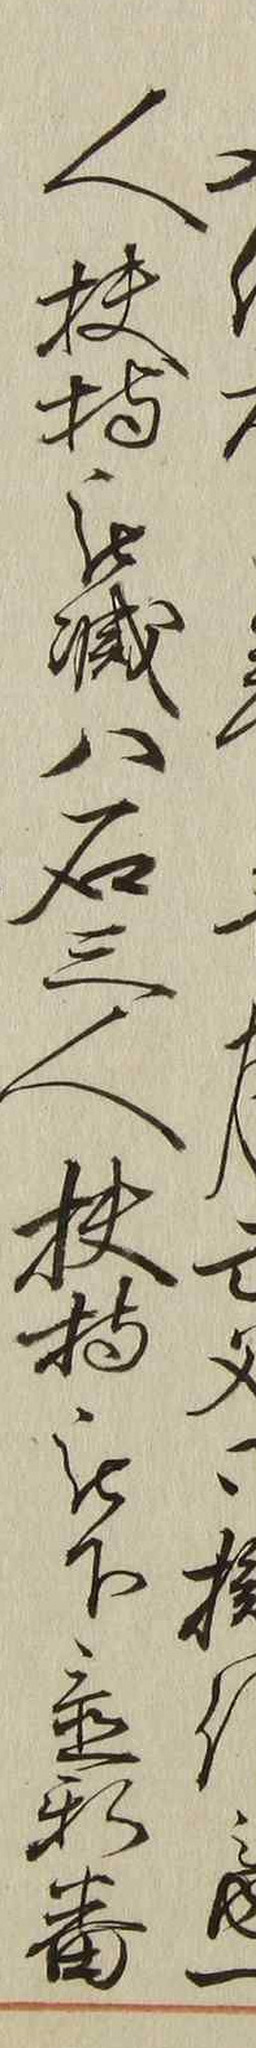人扶持被減八石三人扶持被下置新番
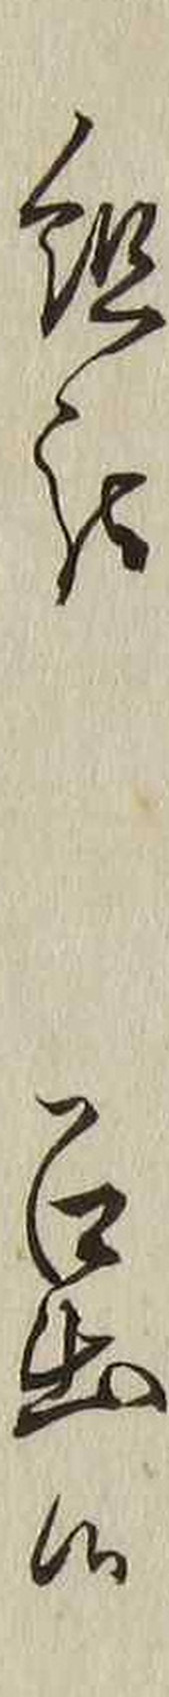組被召出候
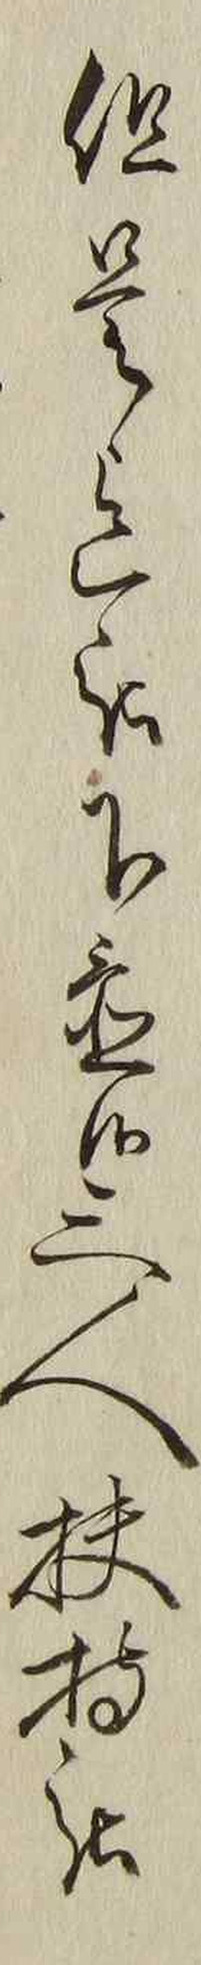但是迄被下置候三人扶持被
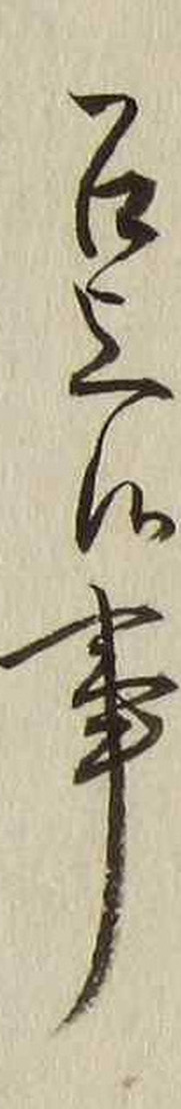召上候事
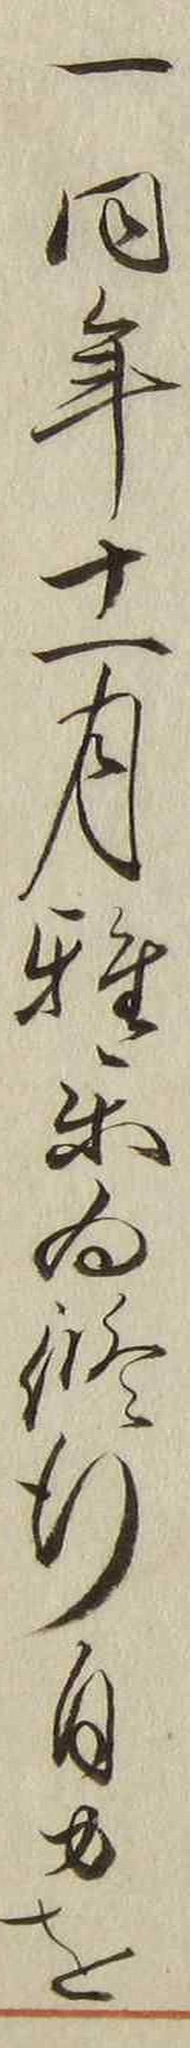一同年十一月雅楽為修行自力を

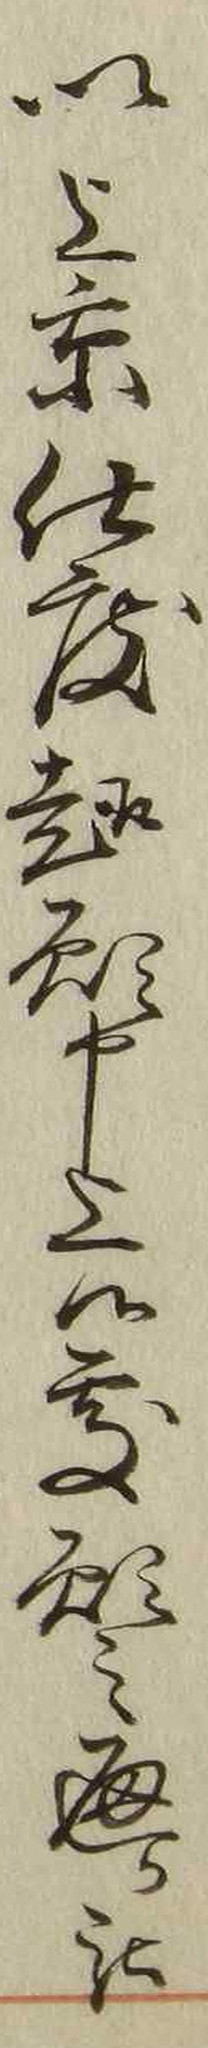以上京仕度趣願申上候処願之通り被
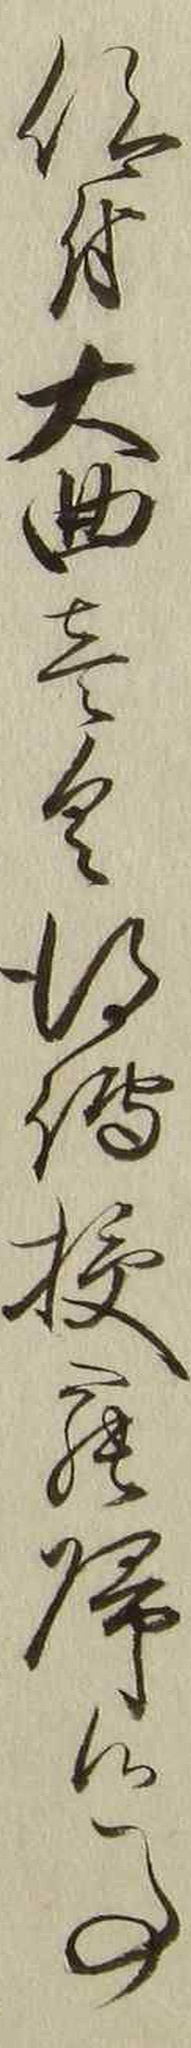仰付大曲壱具得伝授罷帰候事
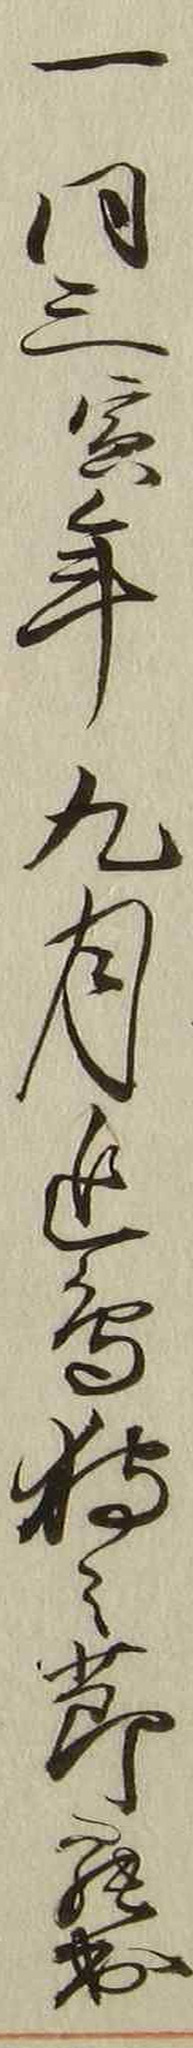一同三寅年九月追鳥狩之節罷出
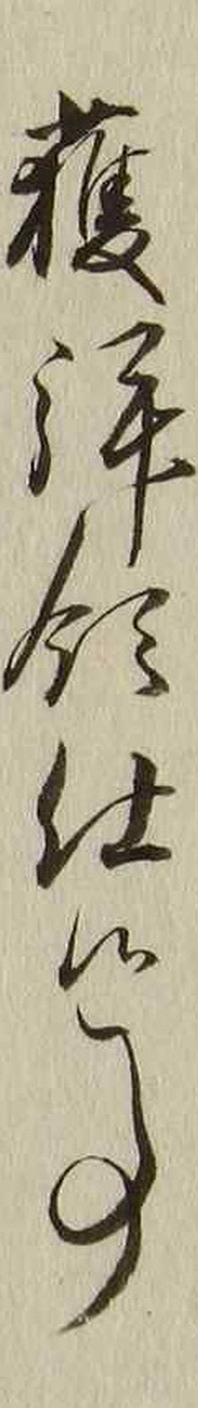獲拝領仕候事
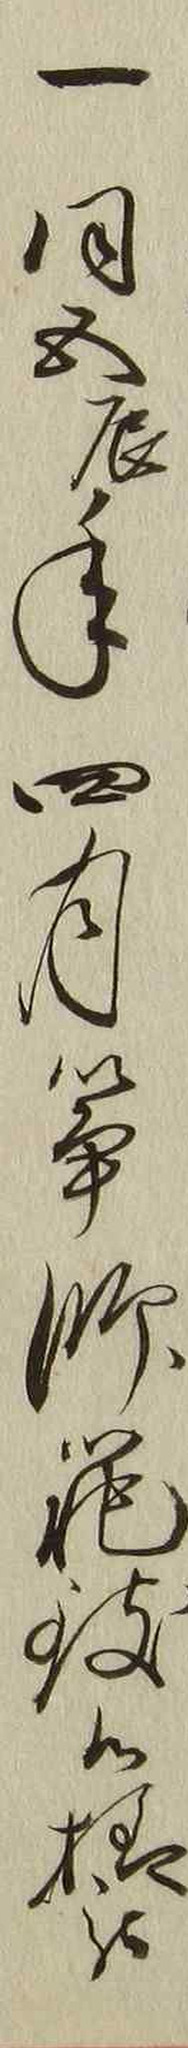一同五辰年四月箏師範致候様被
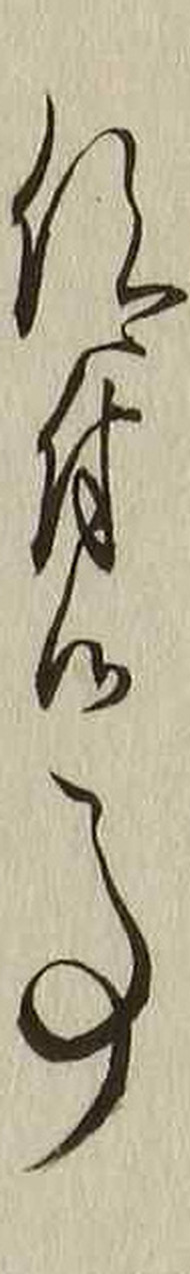仰付候事
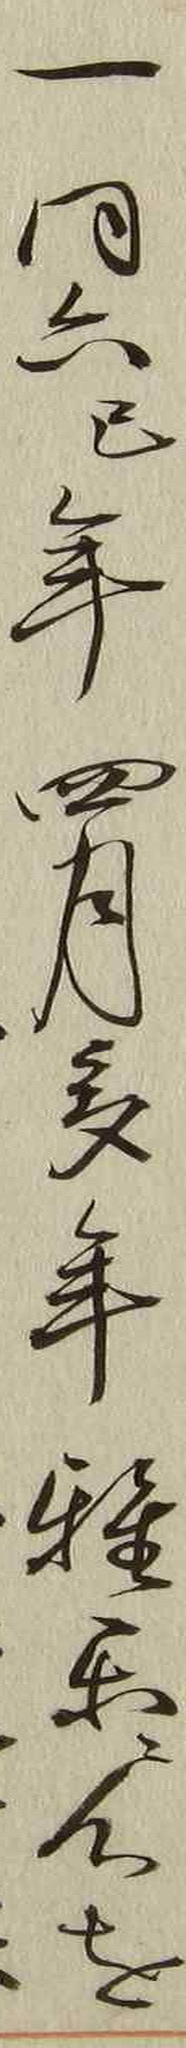一同六巳年四月多年雅楽ニ心を
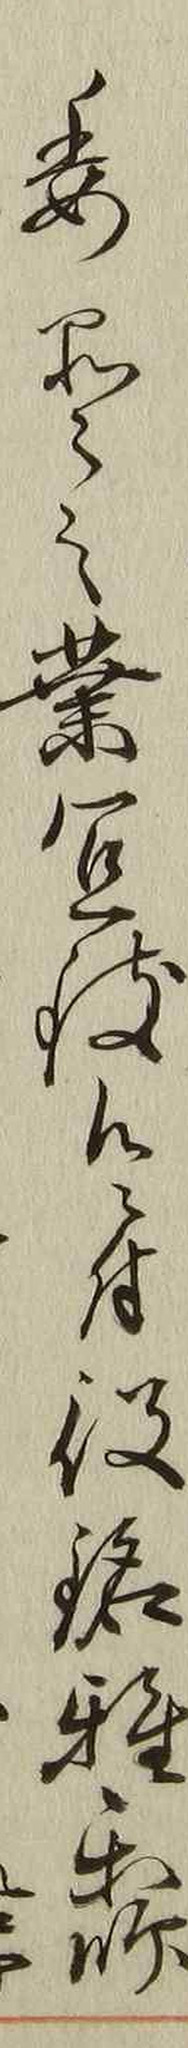委品々之業宜致候ニ付役銘雅楽師
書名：諸士系譜　巻之57　ほ之部4
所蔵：会津若松市立会津図書館
